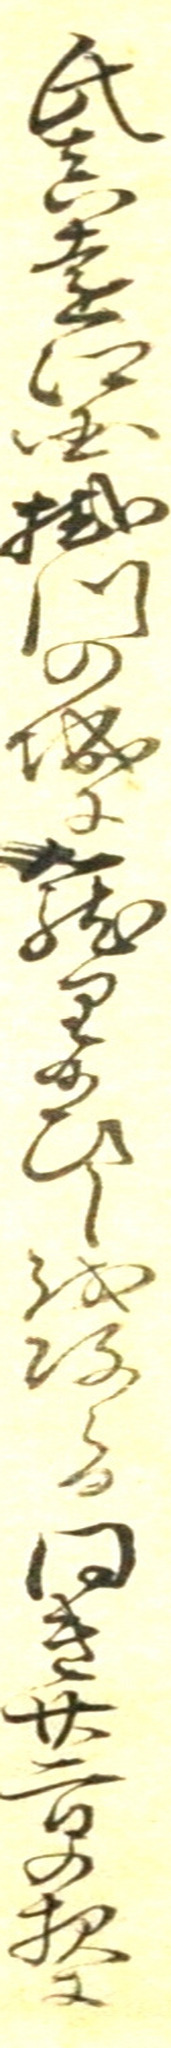氏真遠江国掛川の城に籠り給ひしを攻らる同き廿二日の夜に
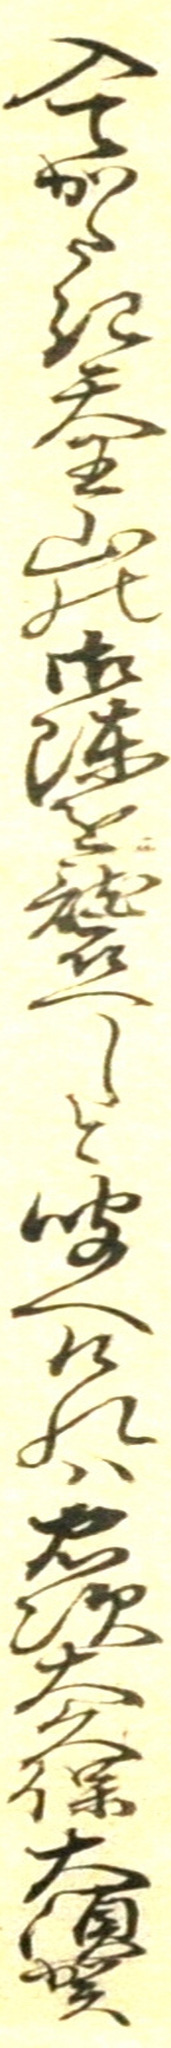入てかたき天王山の御陣を襲へしと聞へけれは忠次大久保大須賀
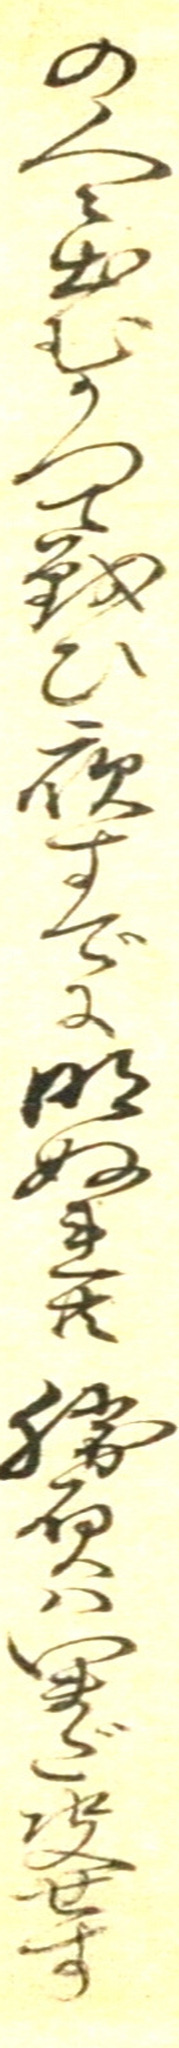の人々出むかつて戦ひ夜すでに明ぬれ共勝負はいまだ決せす
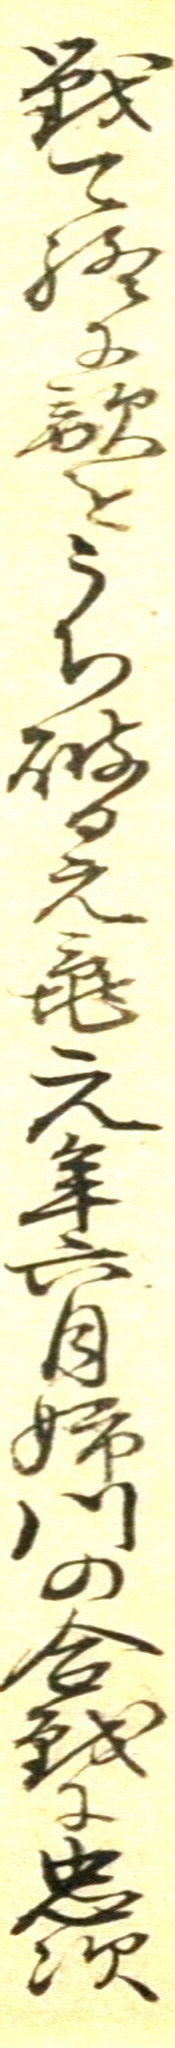戦て終に敵をうち破る元亀元年六月姉川の合戦に忠次
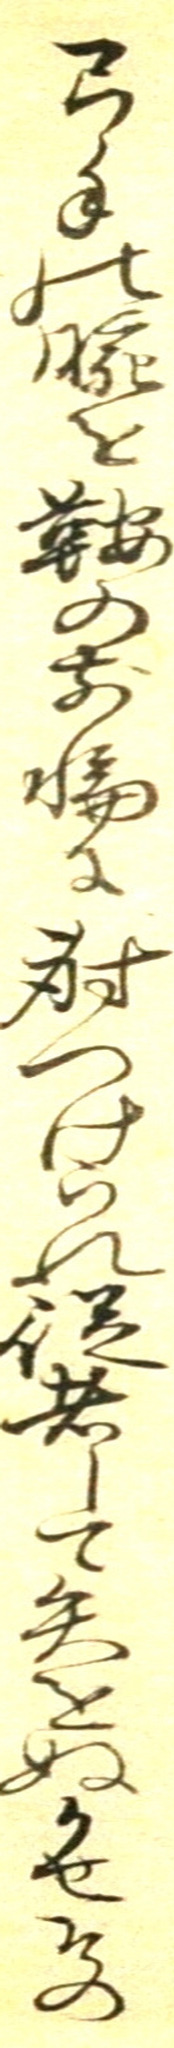弓手の腕を鞍の前輪に射つけられ従者して矢をむかせその
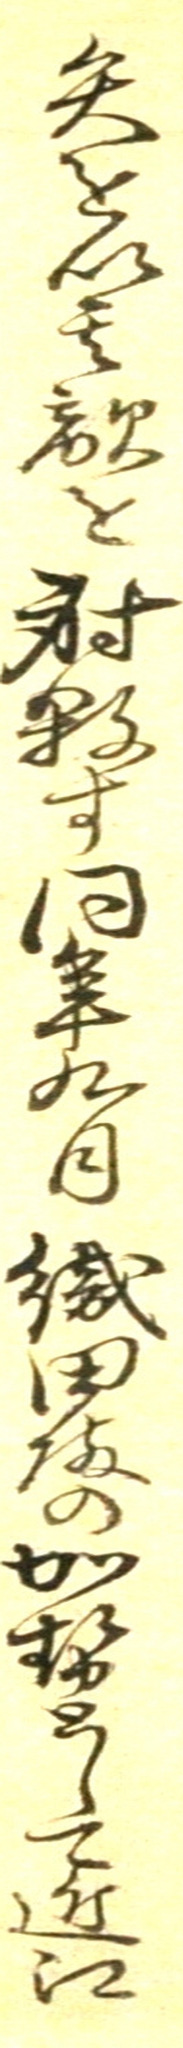矢を以其敵を射殺す同年九月織田殿の加勢として近江
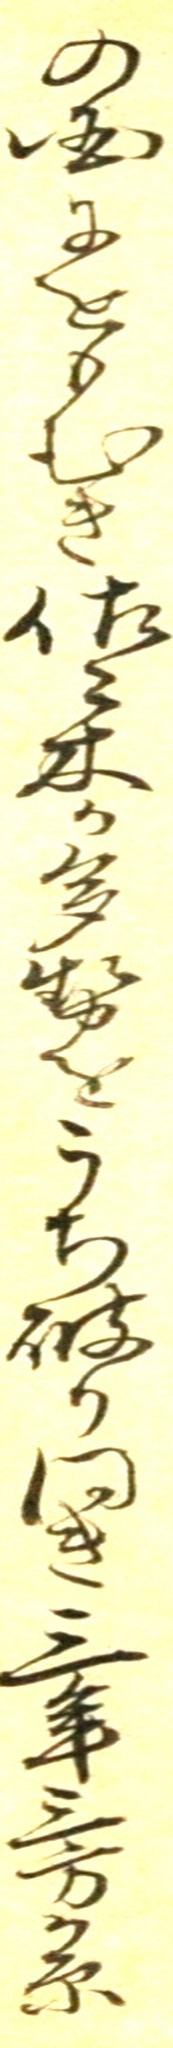の国にをもむき佐々木か多勢をうち破り同き三年三方か原

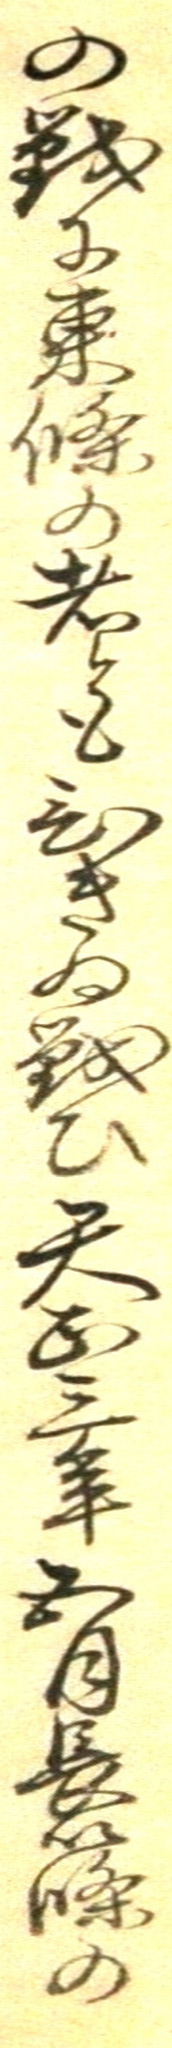の戦に東条の者ともひきゐ戦ひ天正三年五月長篠の
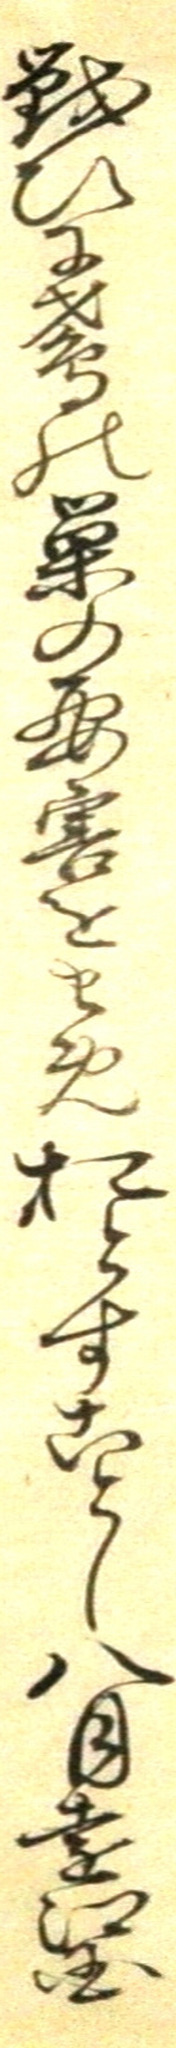戦ひに鳶の巣の要害をせめおとすことし八月遠江国
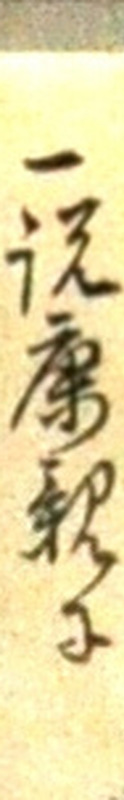一説康親に
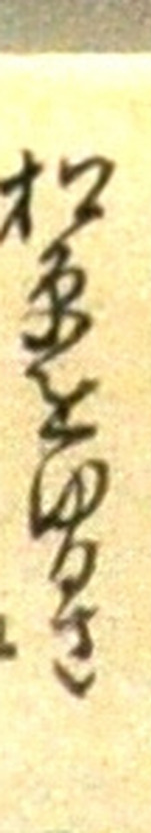松平をゆるさ
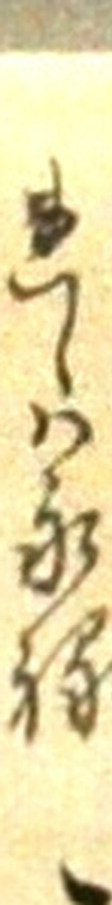れしは永禄
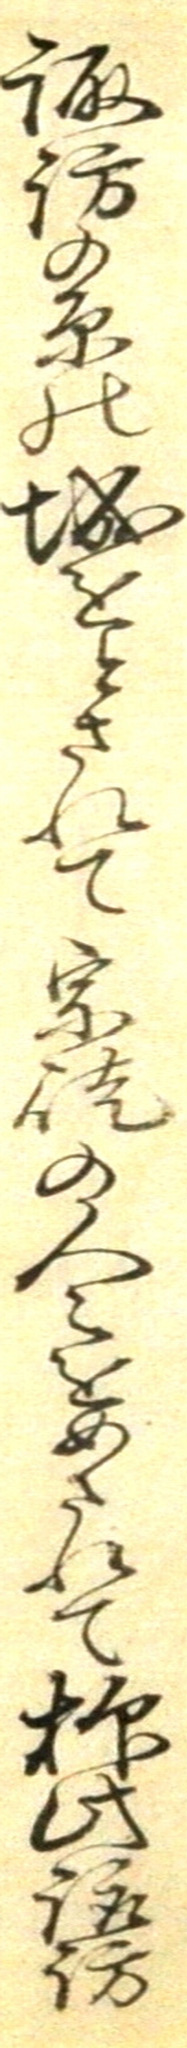諏訪の原の城をとされて宗徒の人々をめされて抑此諏訪
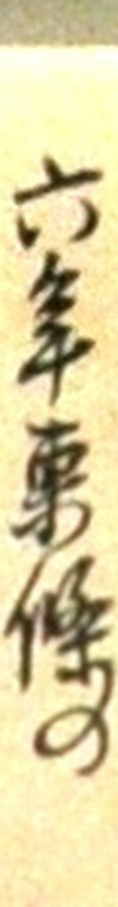六年東条の
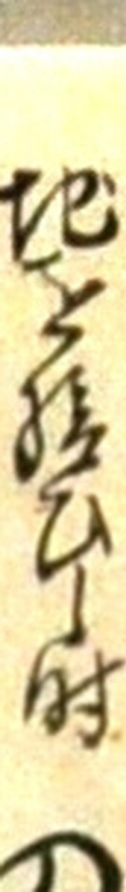地を給ひし時
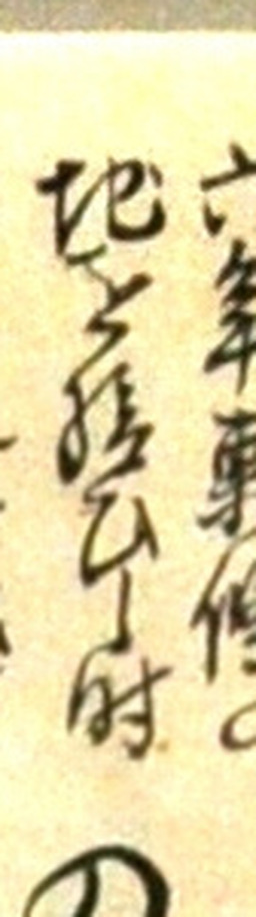地を給ひし時
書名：藩翰譜（四・下）
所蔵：伊那市立高遠町図書館・合同会社AMANE
